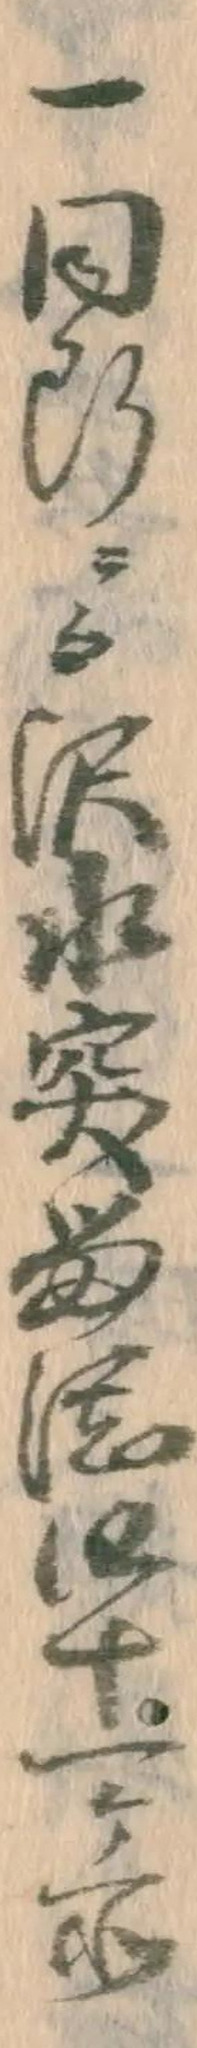一同断二而沢水突留湛四十一ヶ所
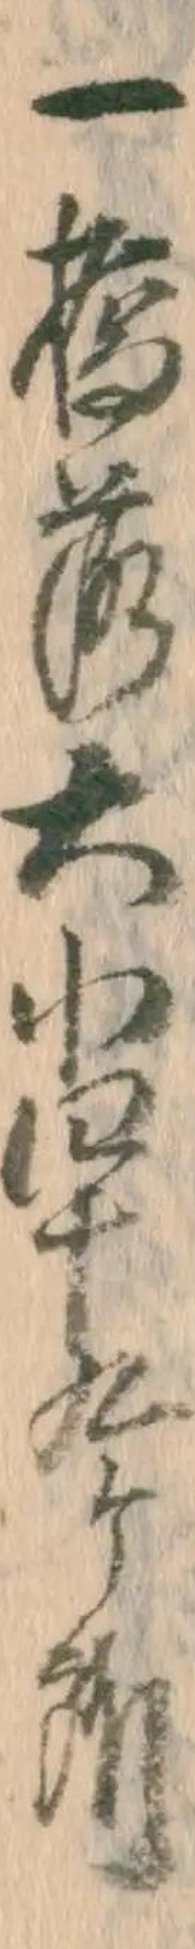一橋落大小十九ヶ所
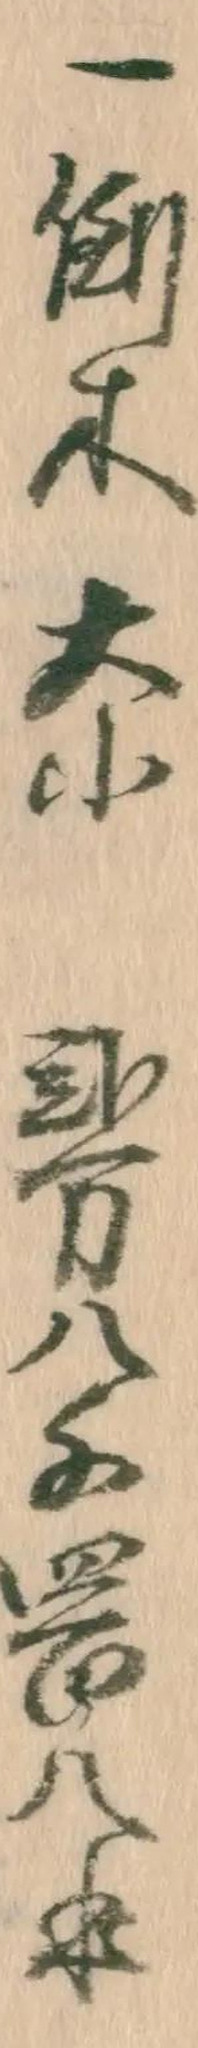一倒木大小二万八千四百八本
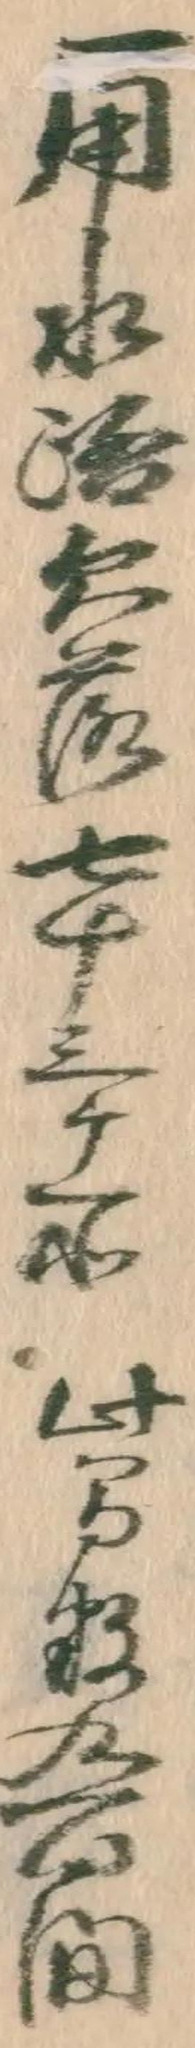一用水路欠落七十三ヶ所此間数九百間
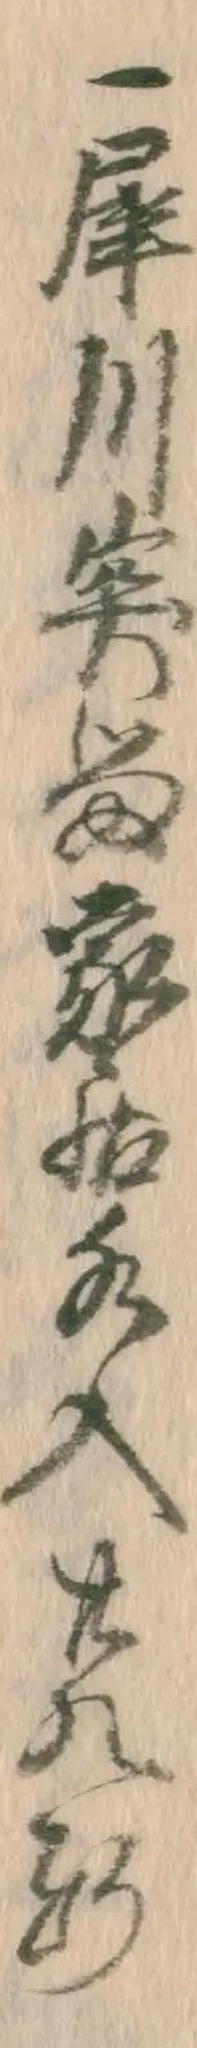一犀川突留家居水入廿九軒
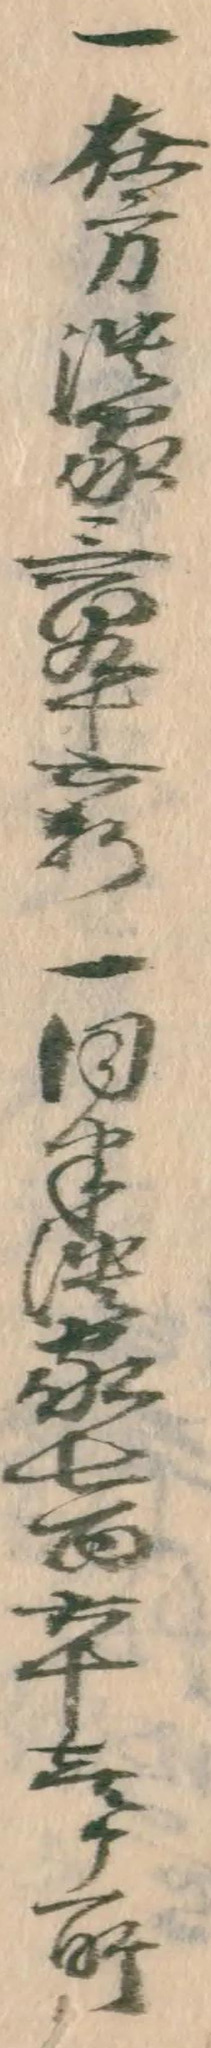一在方潰家三百九十六軒一同半潰家七百六十壱ヶ所
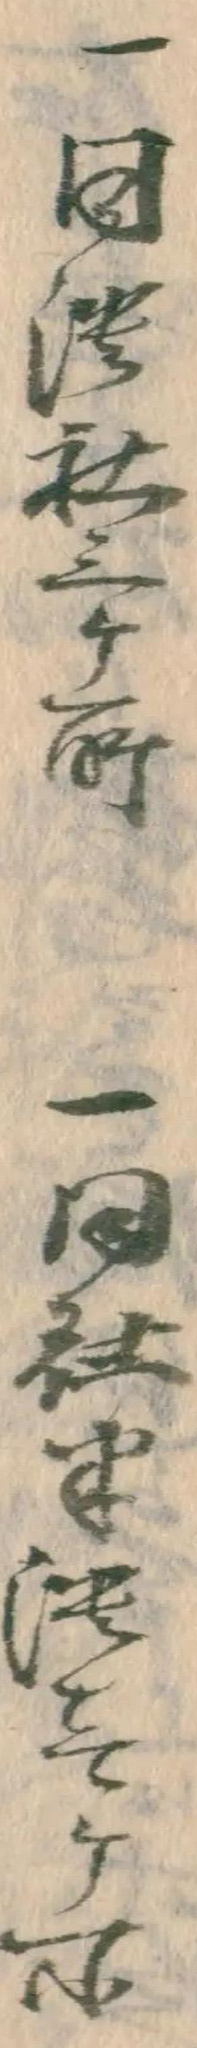一同潰社三ヶ所一同社半潰壱ヶ所
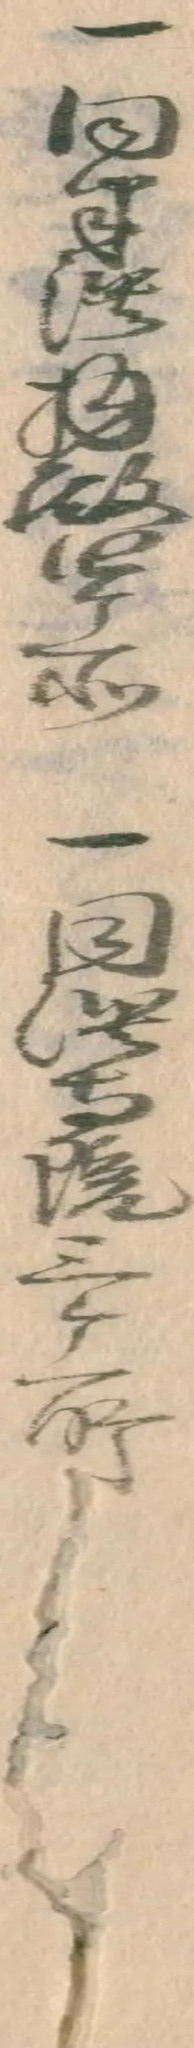一同半潰拝殿四ヶ所一同潰寺院三ヶ所
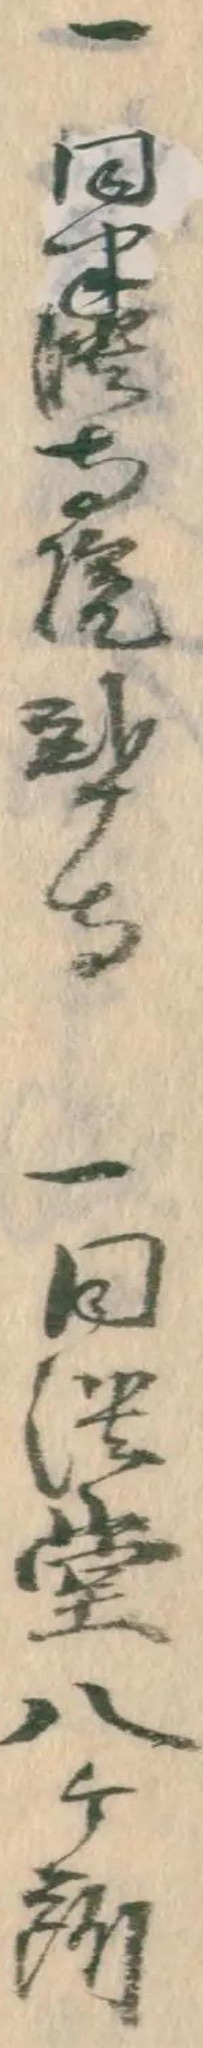一同半潰寺院弐ヶ所一同潰堂八ヶ所
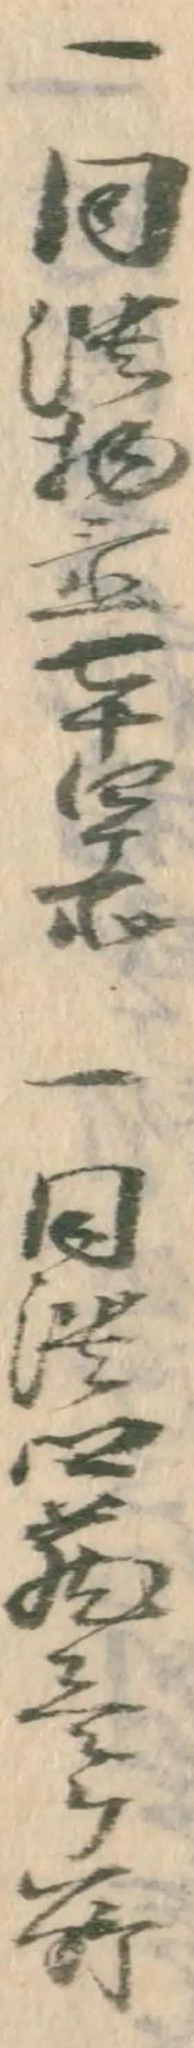一同潰物置七十四ヶ所一同潰郷蔵壱ヶ所

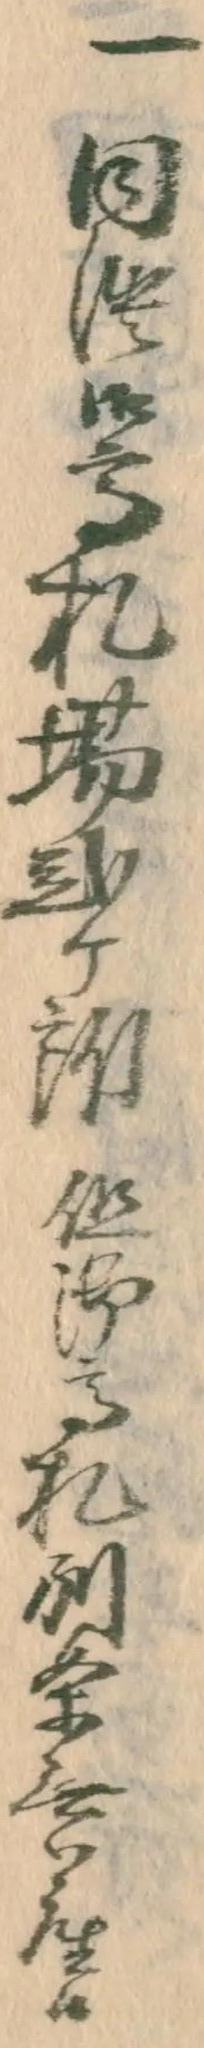一同潰御高札場弐ヶ所但御高札別条無御座候
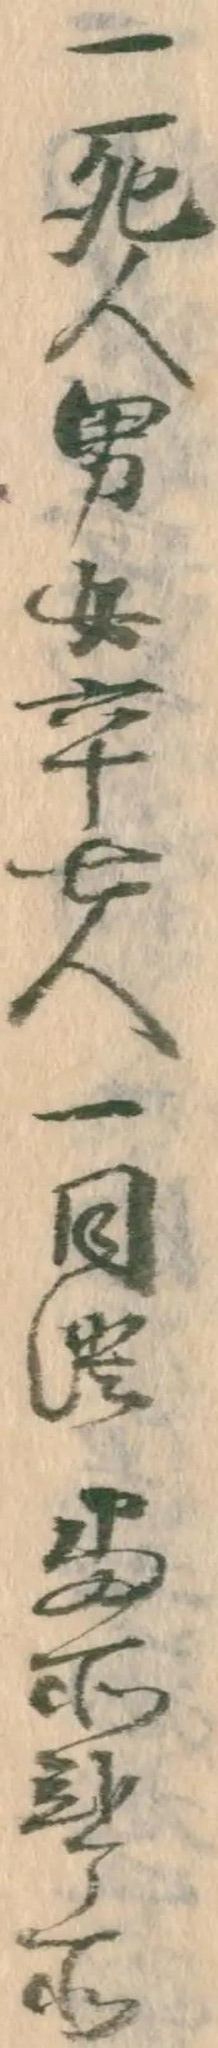一死人男女六十七人一同潰番所弐ヶ所
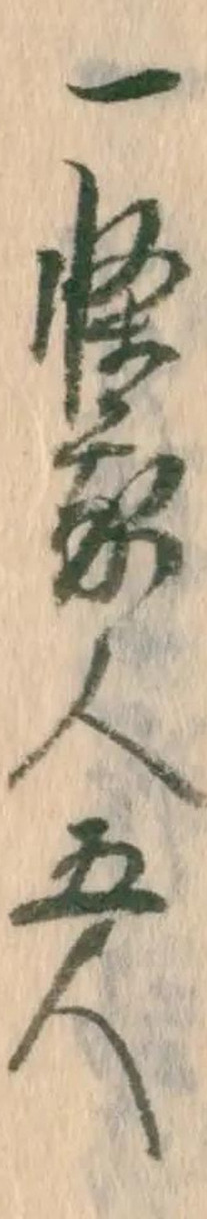一怪我人五人
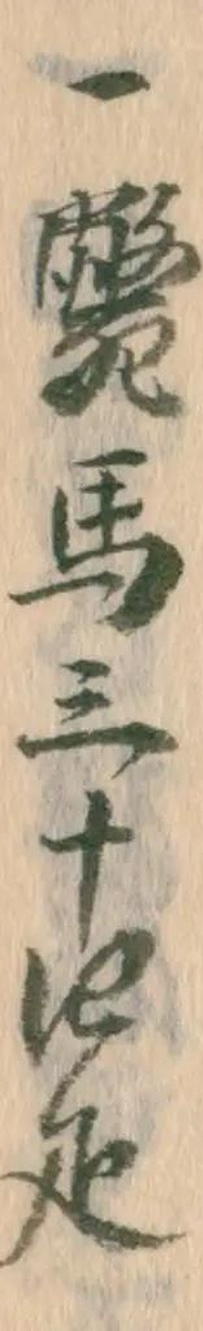一斃馬三十四疋
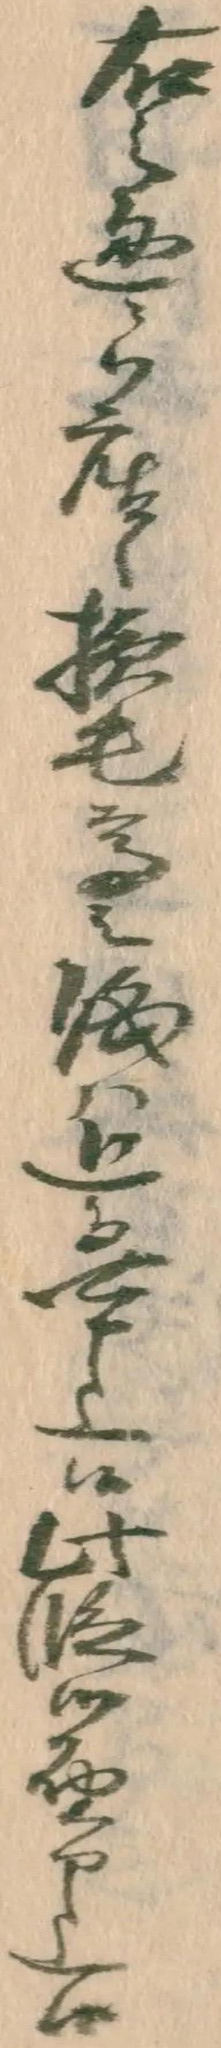右之通り御座候損毛高之儀ハ追而可申上候此段御届申候
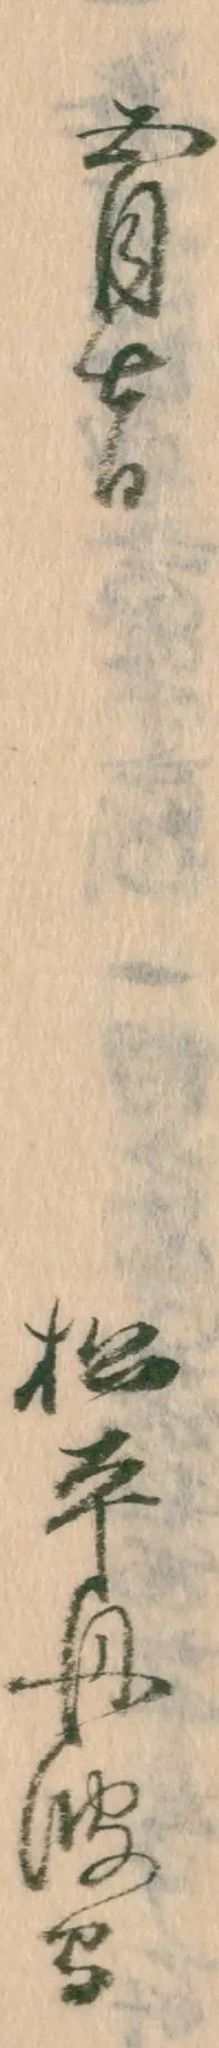五月七日松平丹守丹波守
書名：信州大地震之記
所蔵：国立国会図書館 National Diet Library, JAPAN
